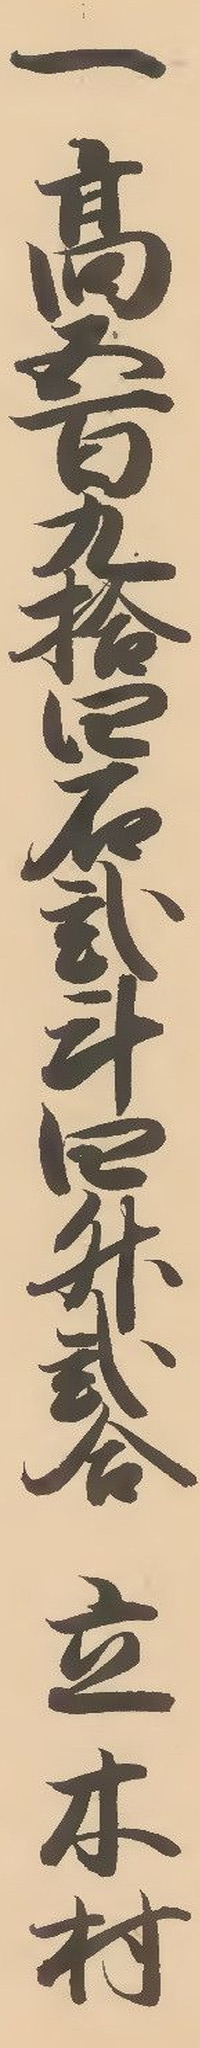一高五百九拾四石弐斗四升弐合立木村
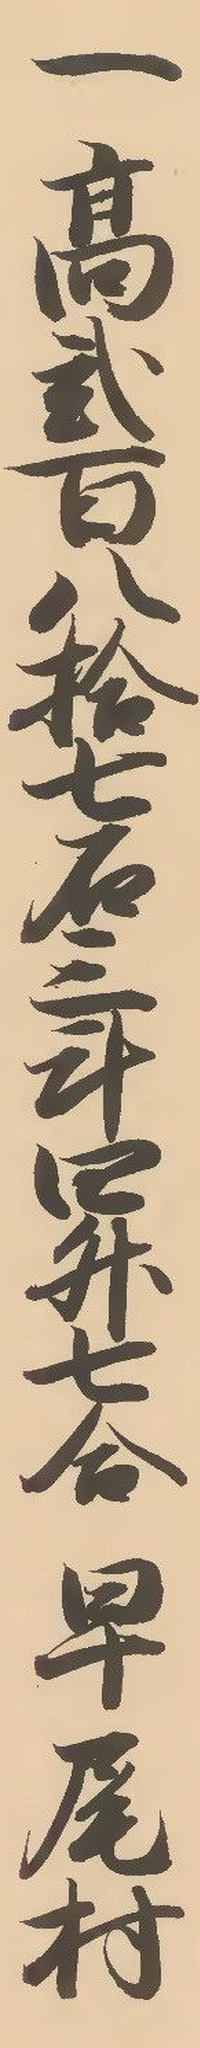一高弐百八拾七石三斗四升七合早尾村
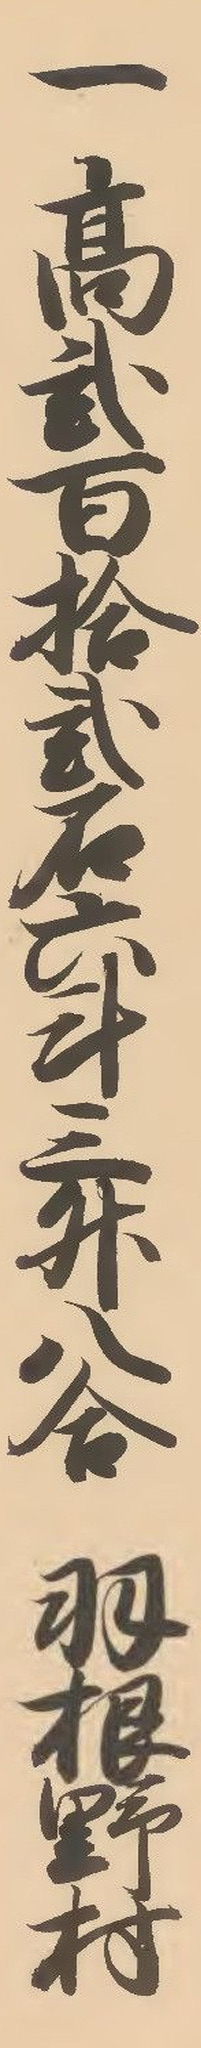一高弐百拾弐石六斗三升八合羽根野村
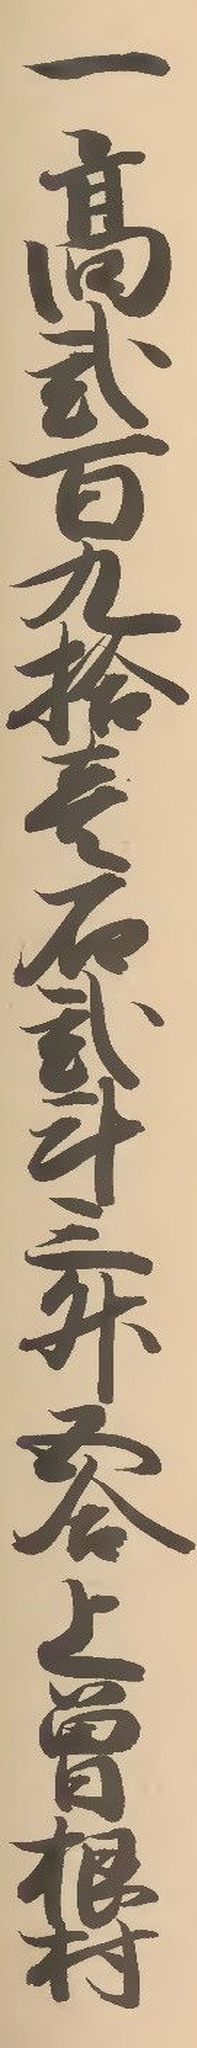一高弐百九拾壱石弐斗三升五合上曽根村
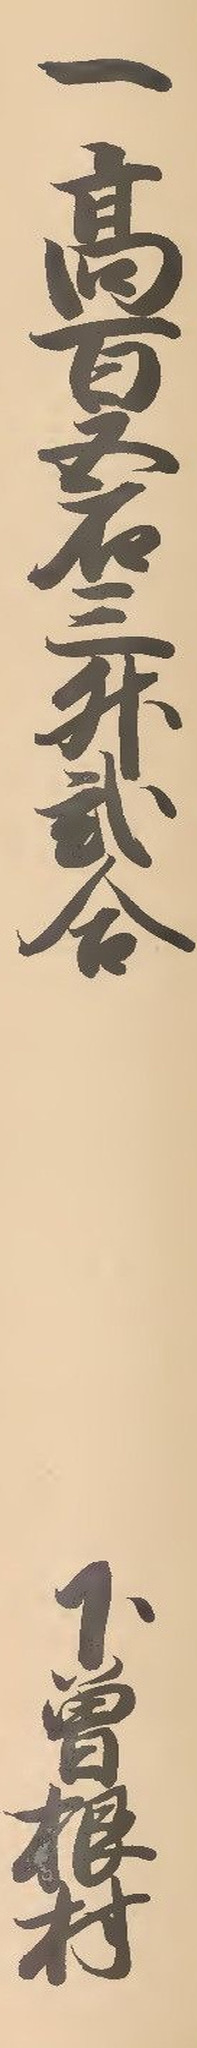一高百五石三升弐合下曽根村
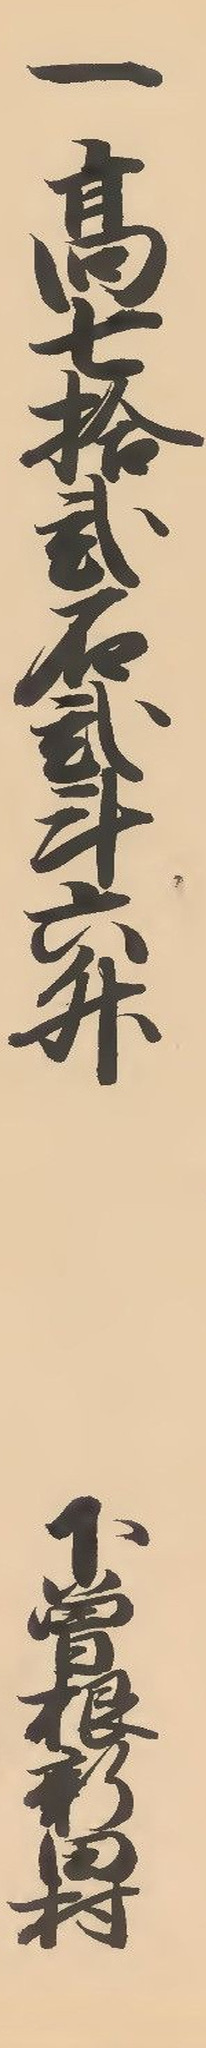一高七拾弐石弐斗六升下曽根新田村
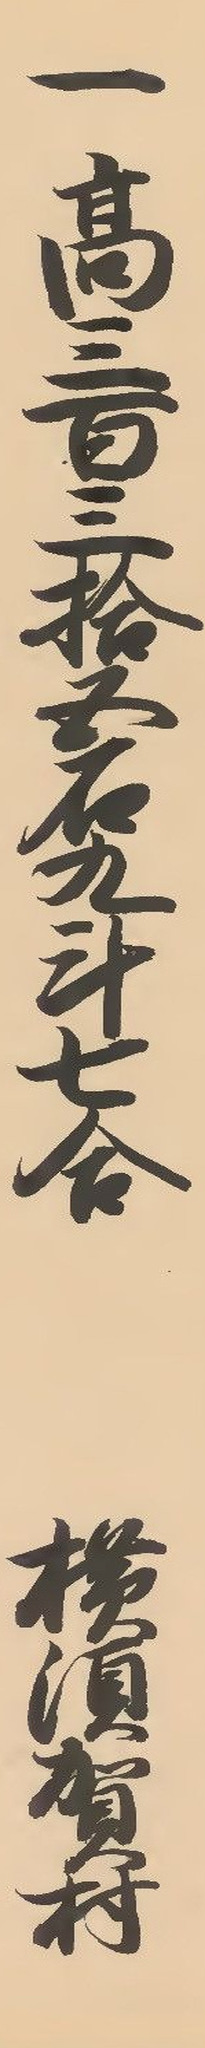一高三百三拾五石九斗七合横須賀村
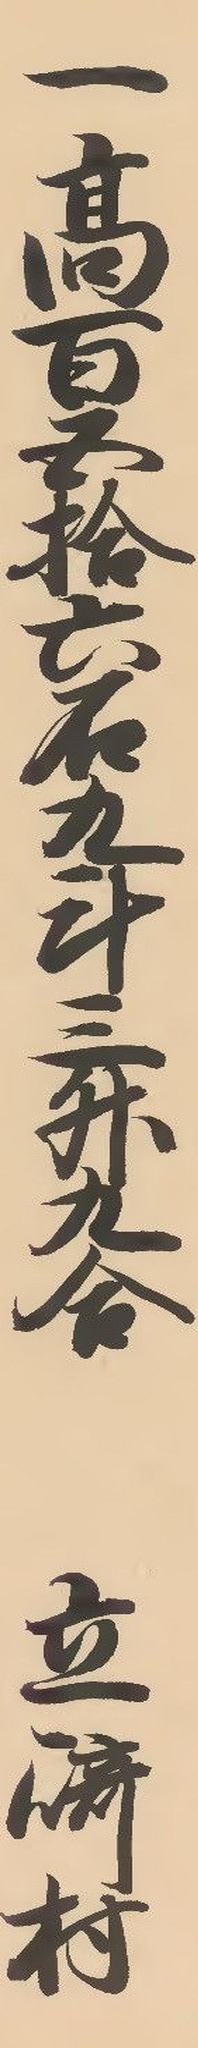一高百五拾六石九斗三升九合立崎村

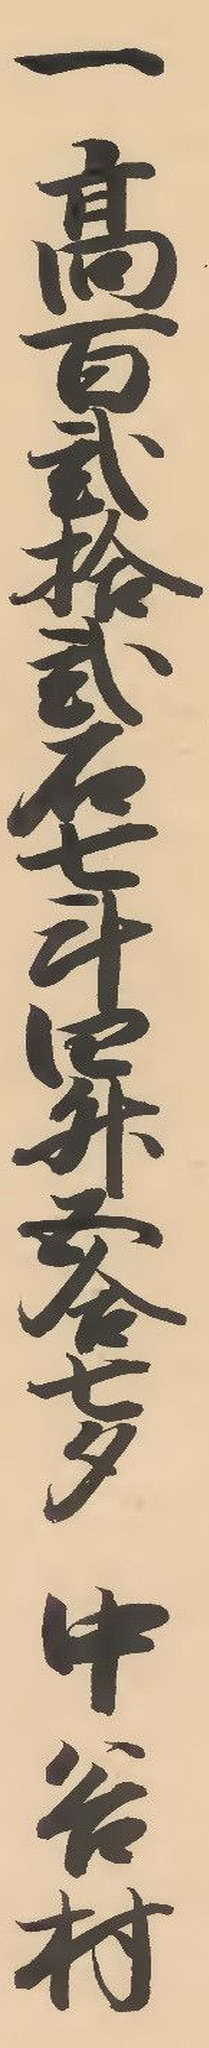一高百弐拾弐石七斗四升五合七勺中谷村
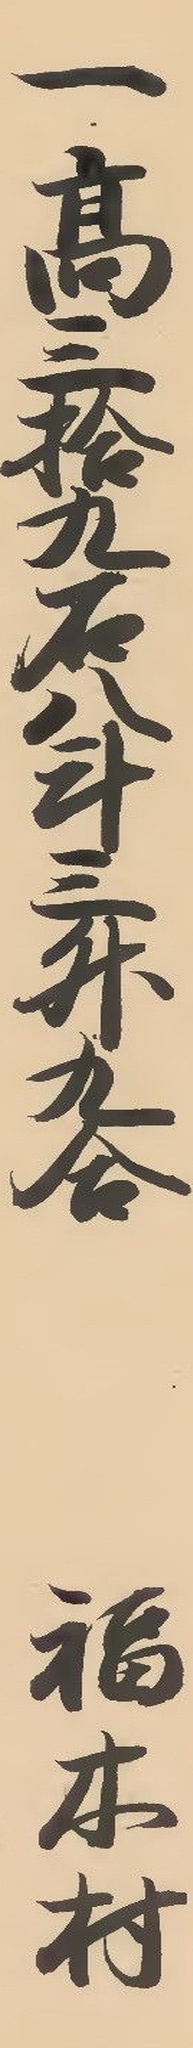一高三拾九石八斗三升九合福木村
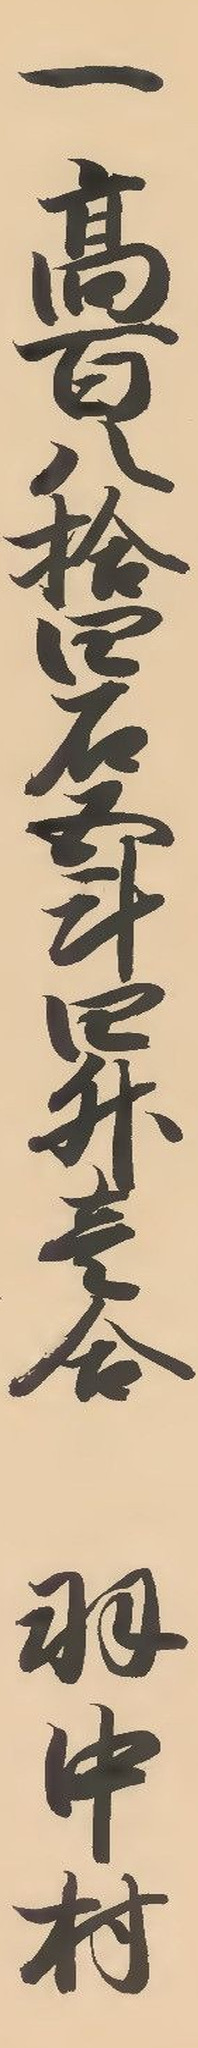一高百八拾四石五斗四升壱合羽中村
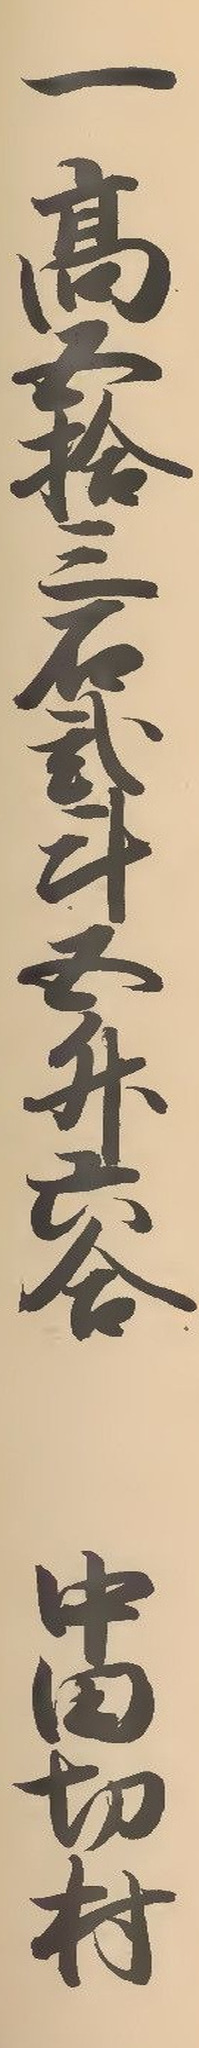一高五拾三石弐斗五升六合中田切村
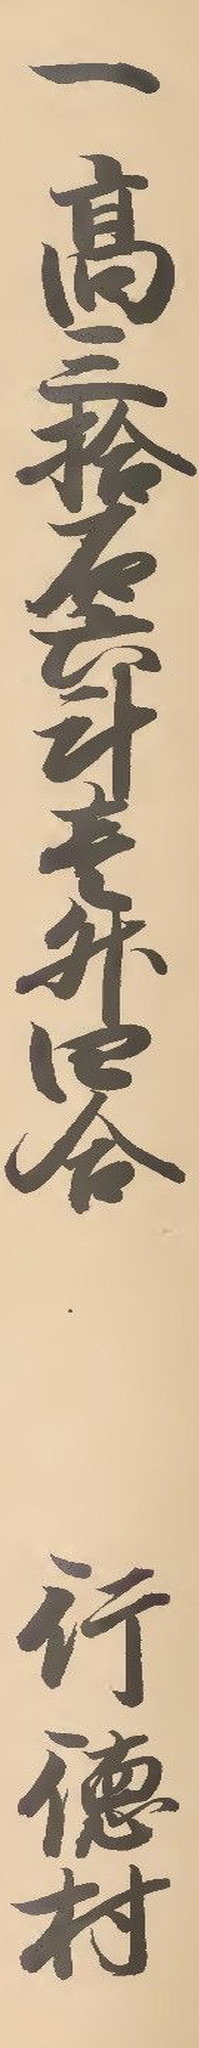一高三拾石六斗壱升四合行徳村
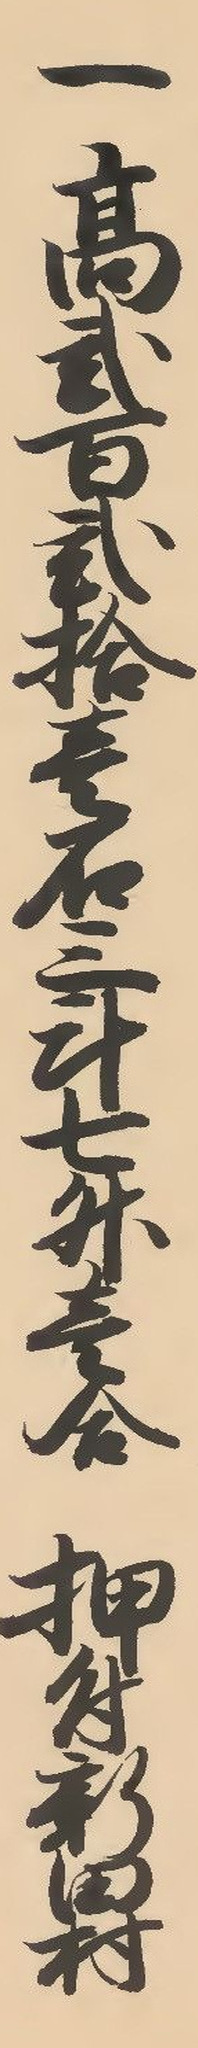一高弐百弐拾壱石三斗七升壱合押付新田村
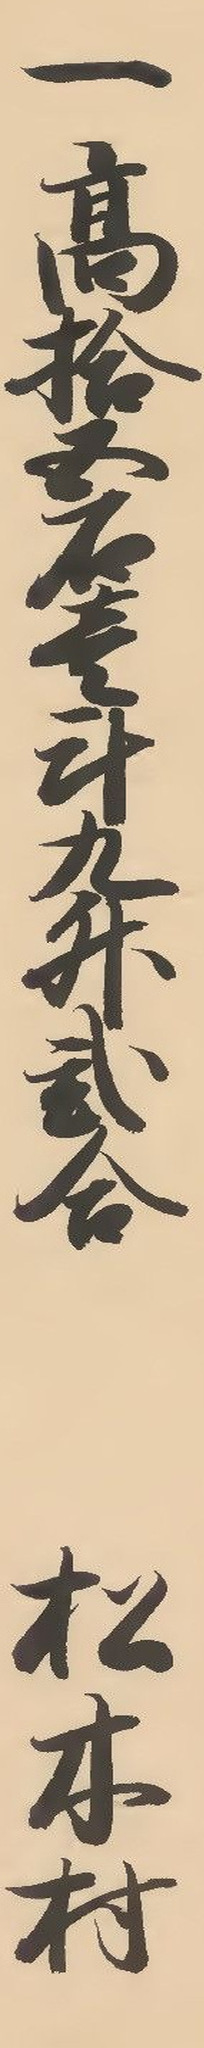一高拾五石壱斗九升弐合松木村
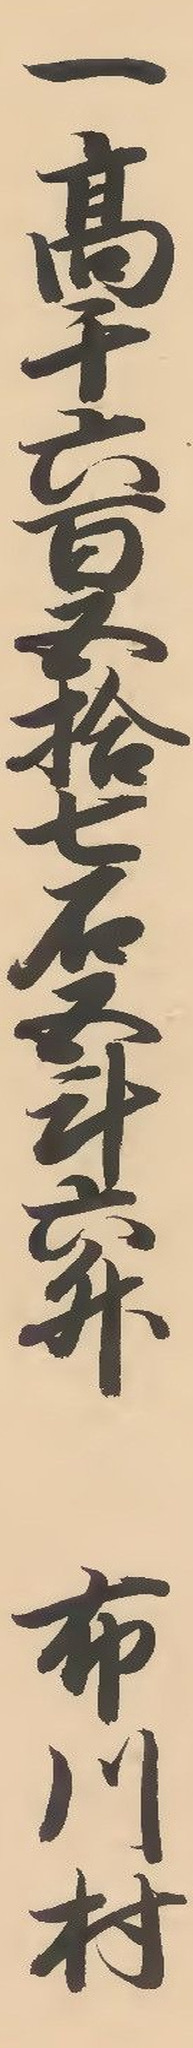一高千六百五拾七石五斗六升布川村
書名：下総国郷帳
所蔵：国立公文書館 National Archives of Japan
